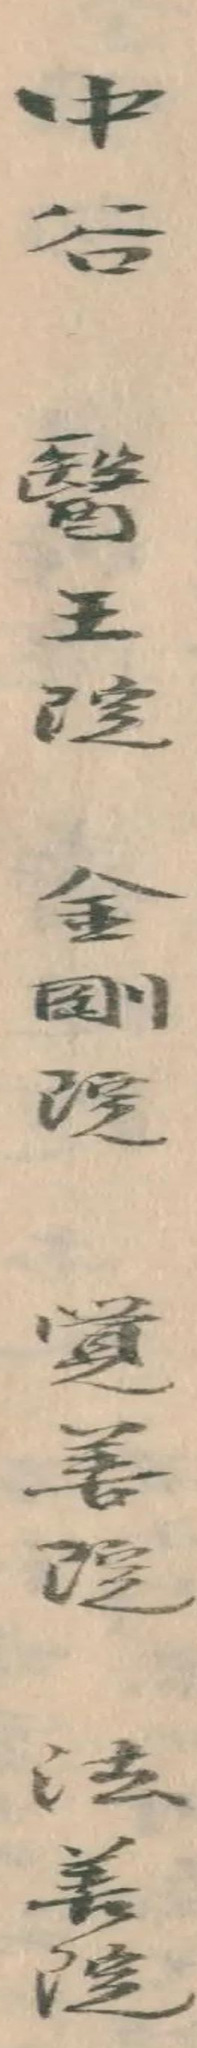中谷医王院金剛院覚善院法善院
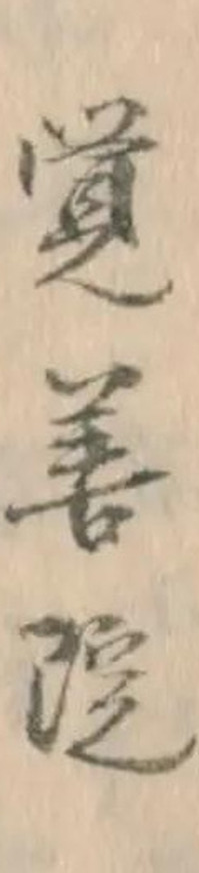教善院
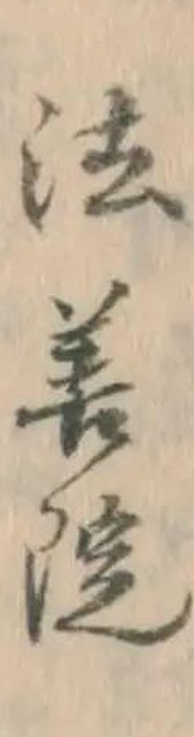教善院
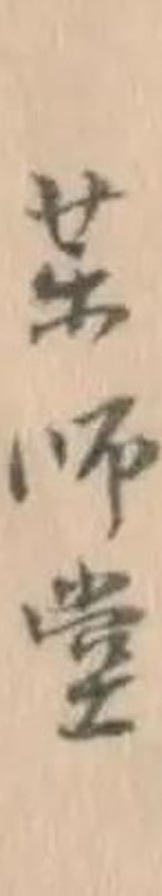寅薬師堂

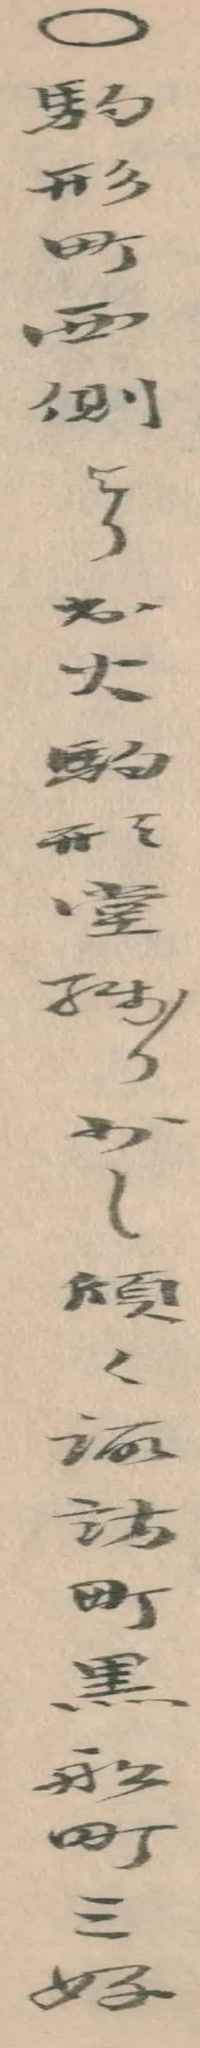〇駒形町西側より出火駒形堂残り少し傾く諏訪町黒船町三好
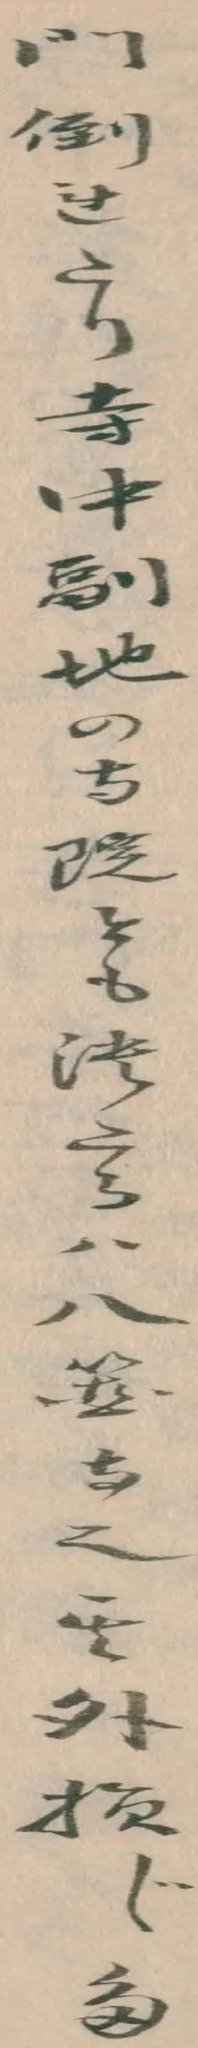門倒れたり寺中副地の寺院とも潰たるは八͡箇寺也其外損じ多
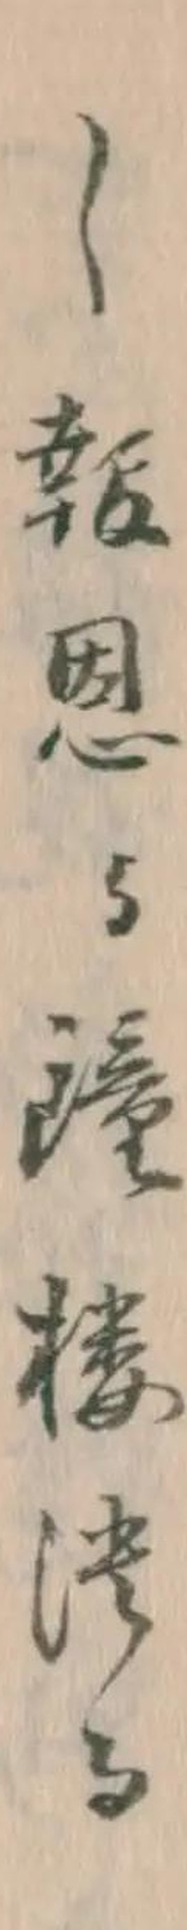し報恩寺鐘楼潰る
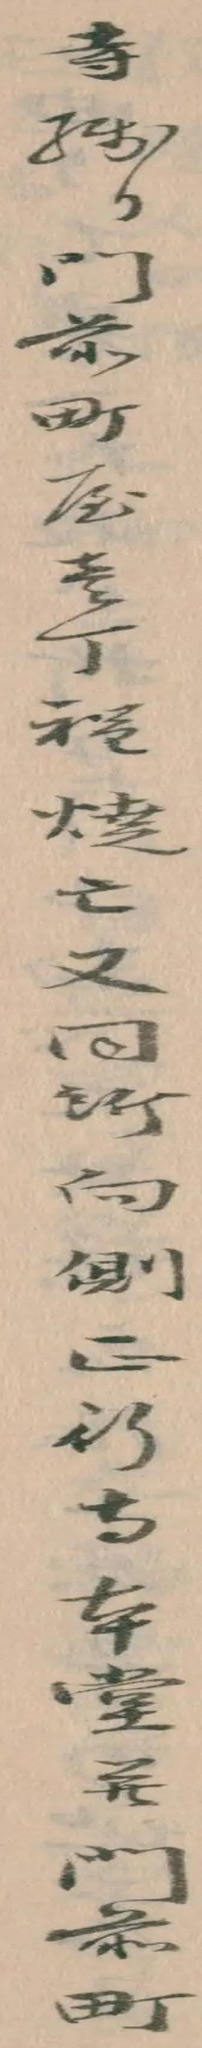寺残り門前町屋壱丁程焼亡又同所向側正行寺本堂并門前町
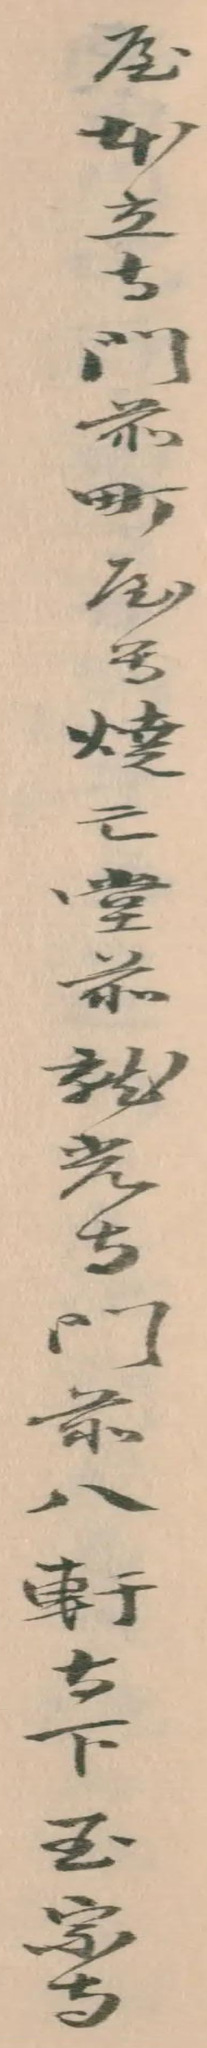屋本立寺門前町屋等焼亡堂前龍光寺門前八軒寺下玉宗寺
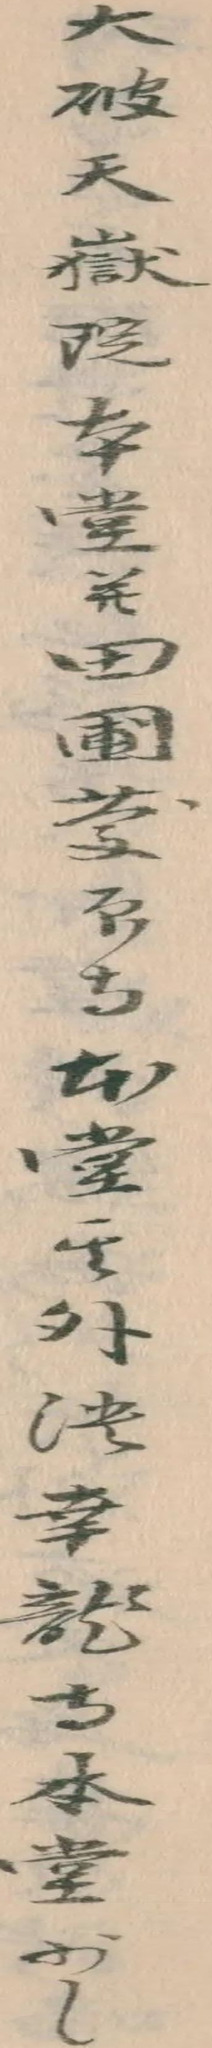大破天嶽院本堂并田圃慶印寺本堂其外潰幸龍寺本堂少し
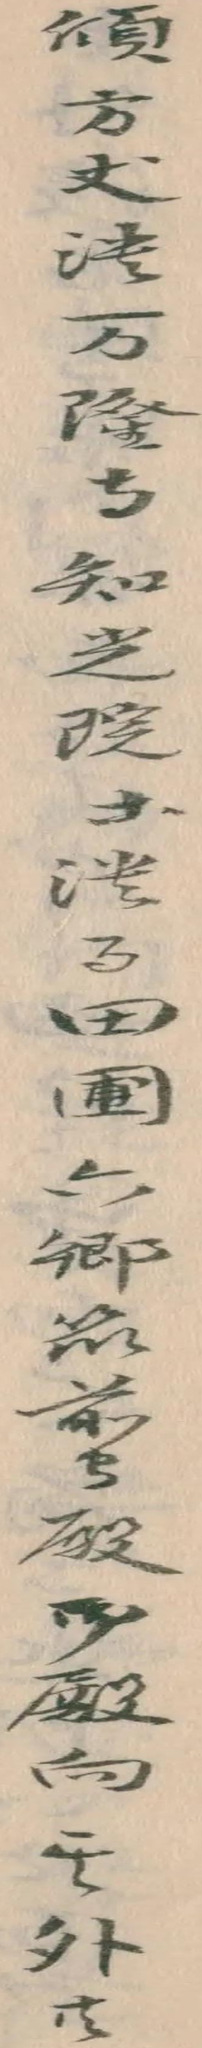傾方丈潰万隆寺知光院等潰る田圃六郷筑前守殿御殿向其外共
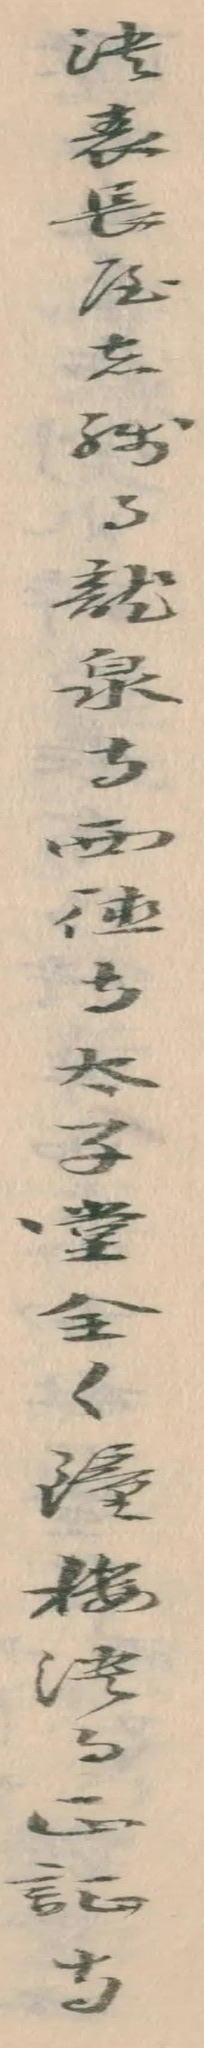潰表長屋は残る龍泉寺西徳寺太子堂全く鐘楼潰る正証寺
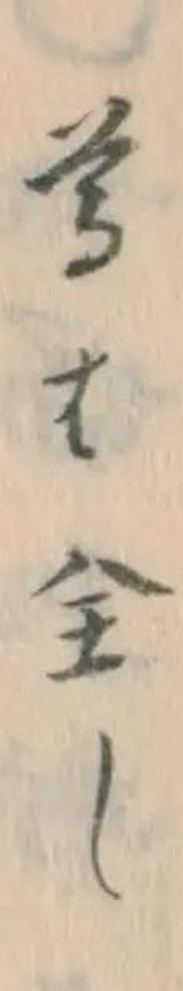尊は全し

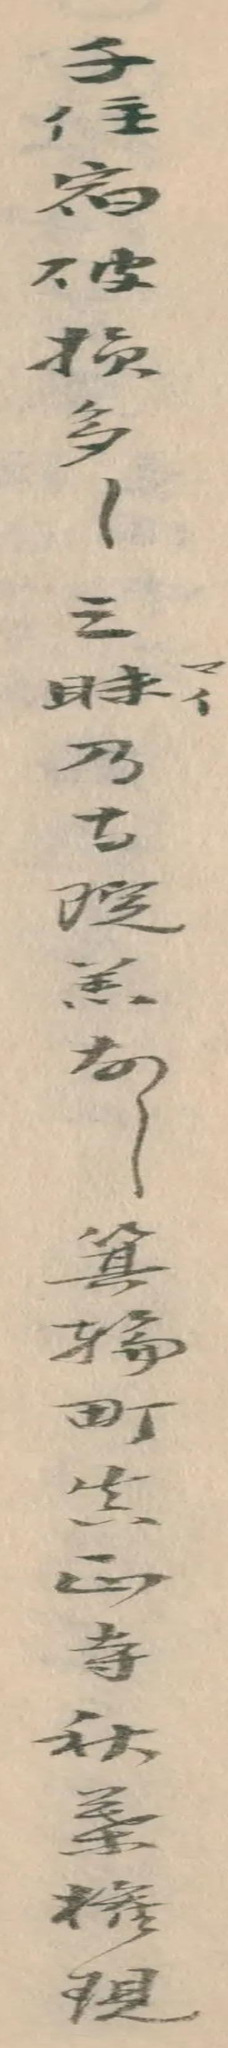千住宿破損多し三昧の寺院恙なし箕輪町真正寺秋葉権現
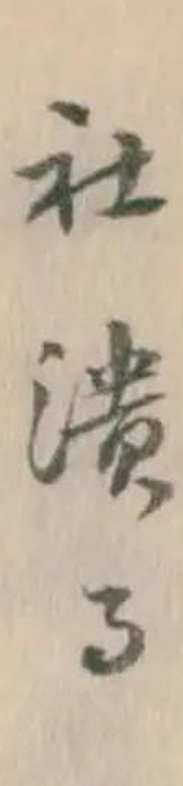社潰る
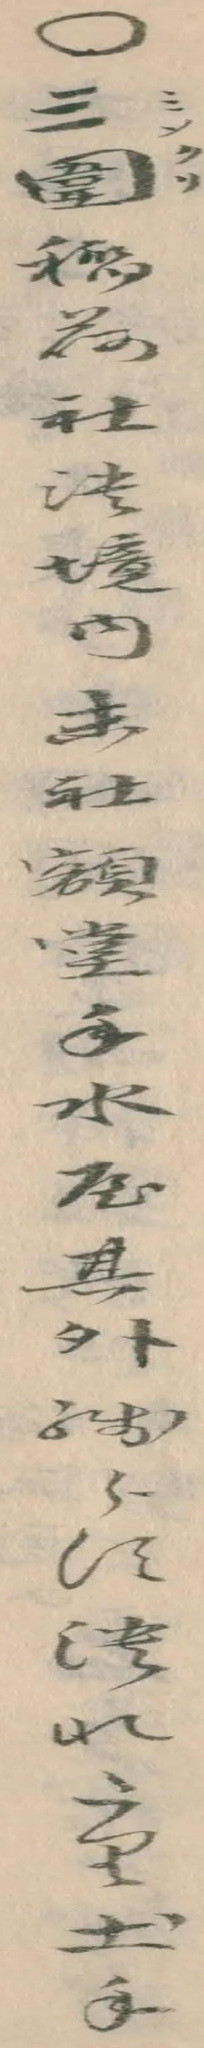〇三圍稲荷社潰境内末社額堂手水屋其外残らす潰れたり土手
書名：地災撮要. 巻7-9(地震之部)
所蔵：国立国会図書館 National Diet Library, JAPAN
